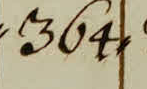364
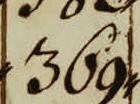369
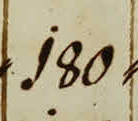180
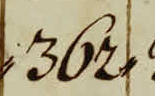362
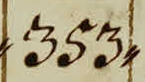353
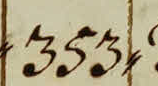353
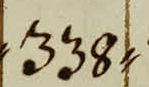338
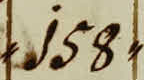158
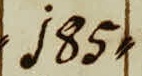185
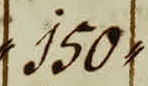150
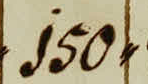150
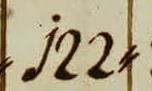122
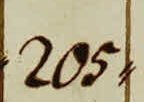205
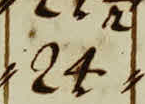24
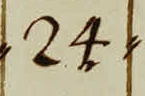24
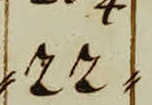22
